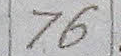76
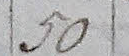50
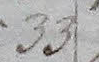33
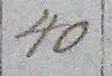40
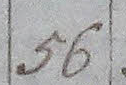56
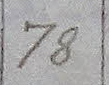78
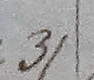31
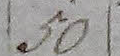50
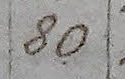80
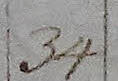34
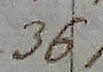36
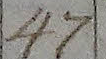47
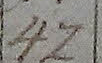42
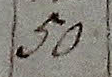50
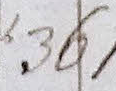36
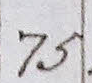75
